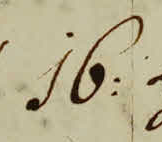16:
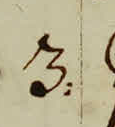3:
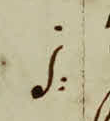1:
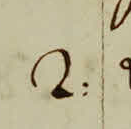2:
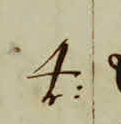4:
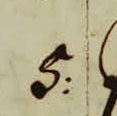5:
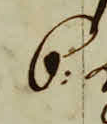6:
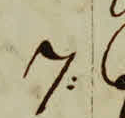7:
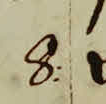8:
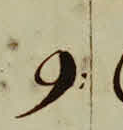9:
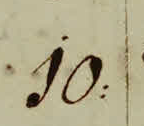10:
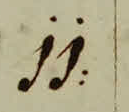11:
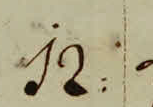12:
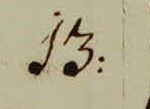13:
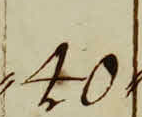40
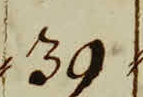39
